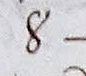8
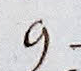9
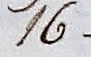16
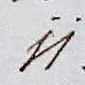11
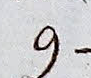9
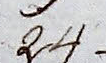24
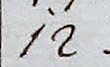12
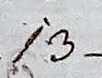13
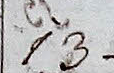13
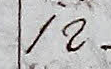12
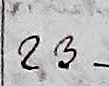23
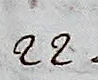22
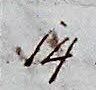14
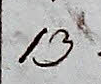13
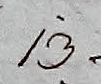13
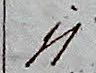11
